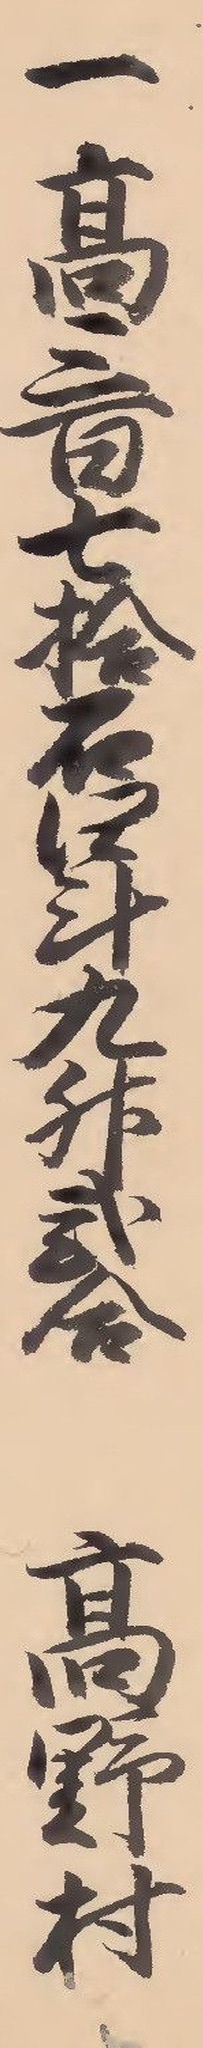一高三百七拾石四斗九升弐合高野村
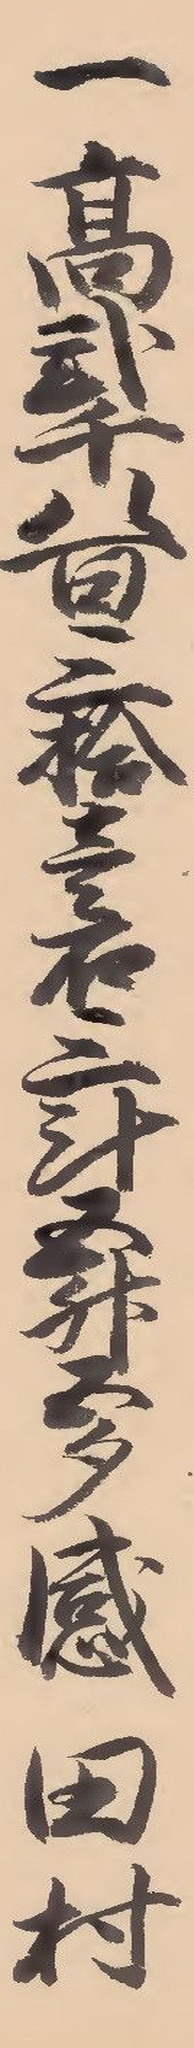一高弐千八百三拾壱石三斗五升五勺感田村

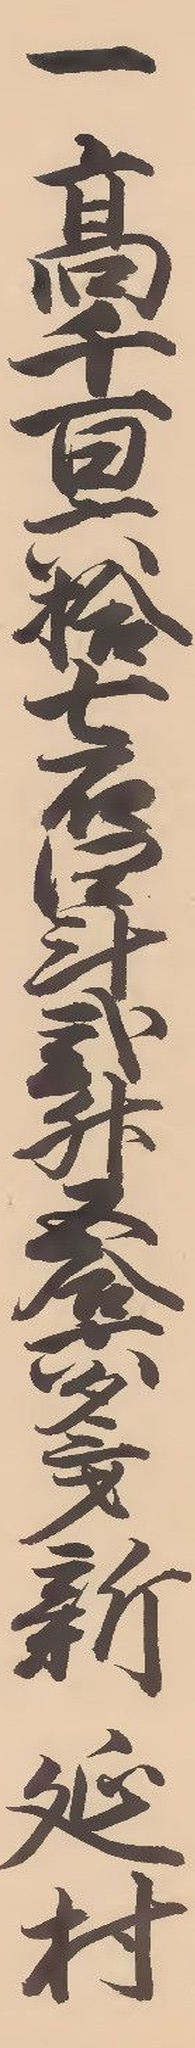一高千百六拾七石四斗弐升五合六勺三才新延村
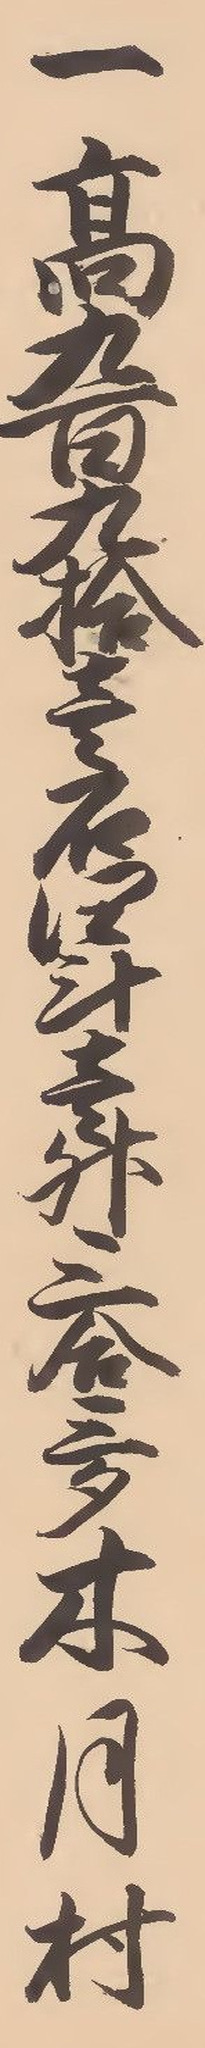一高九百九拾壱石四斗壱升三合三勺木月村
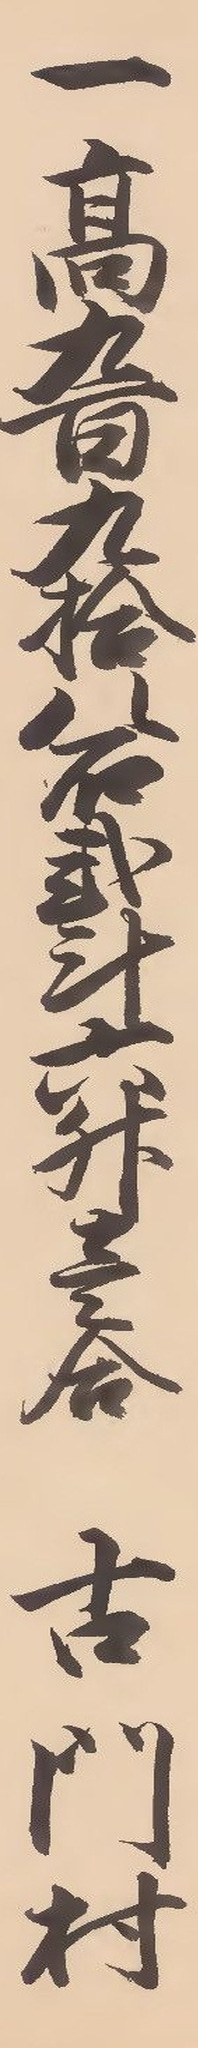一高九百九拾八石弐斗六升壱合古門村
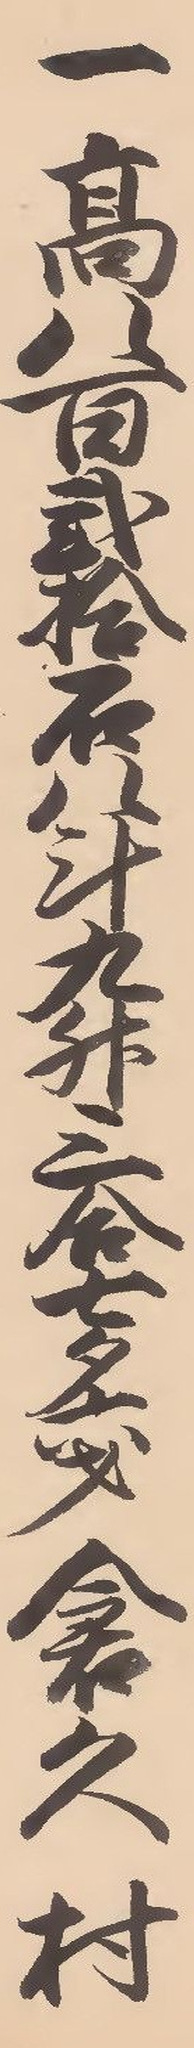一高八百弐拾石八斗九升三合七勺六才倉久村

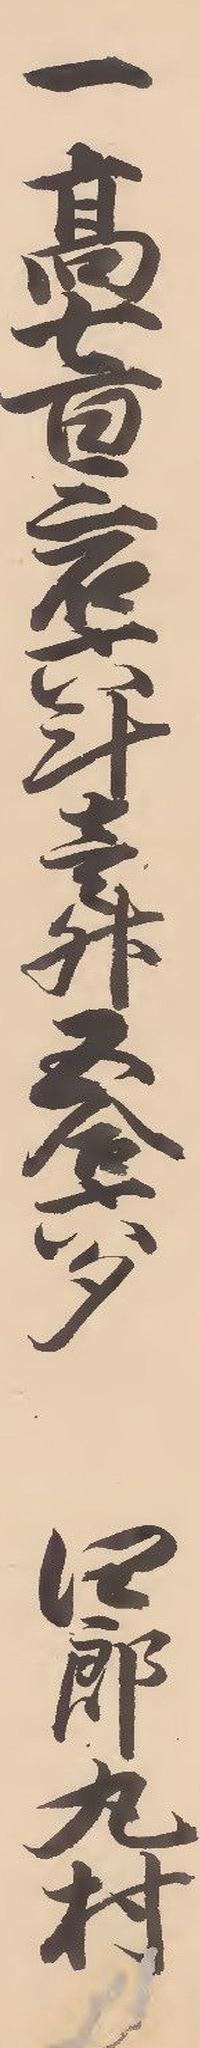一高七百三石六斗壱升五合六勺四郎丸村
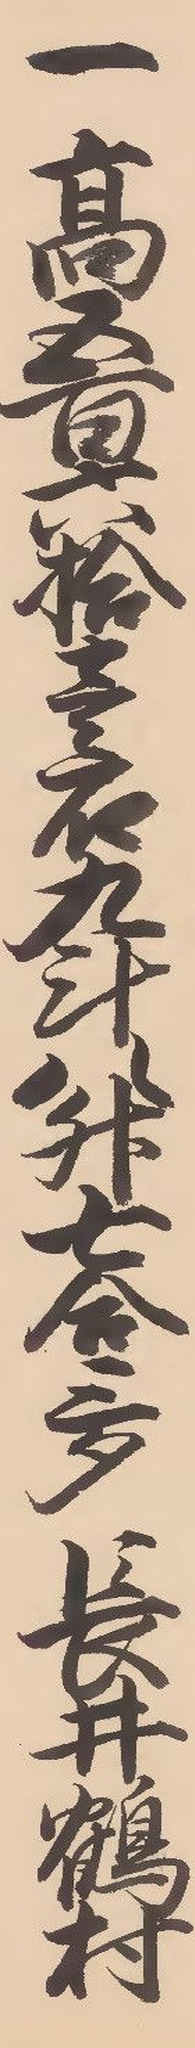一高五百六拾壱石九斗八升七合三勺長井鶴村
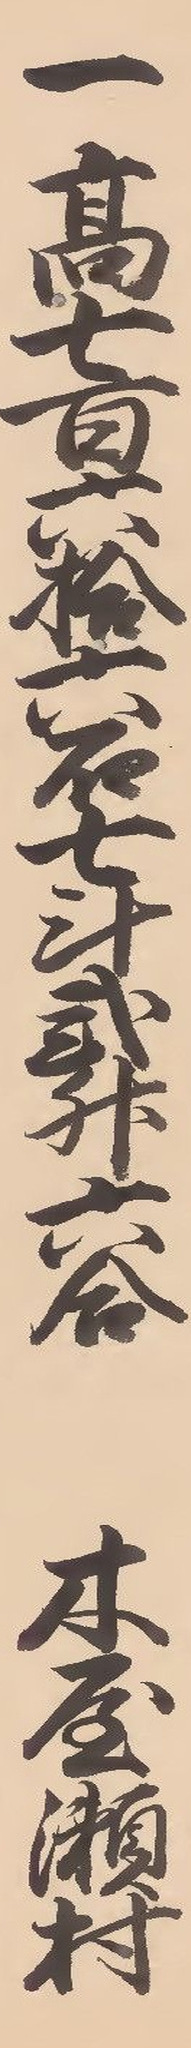一高七百六拾六石七斗弐升六合木屋瀬村
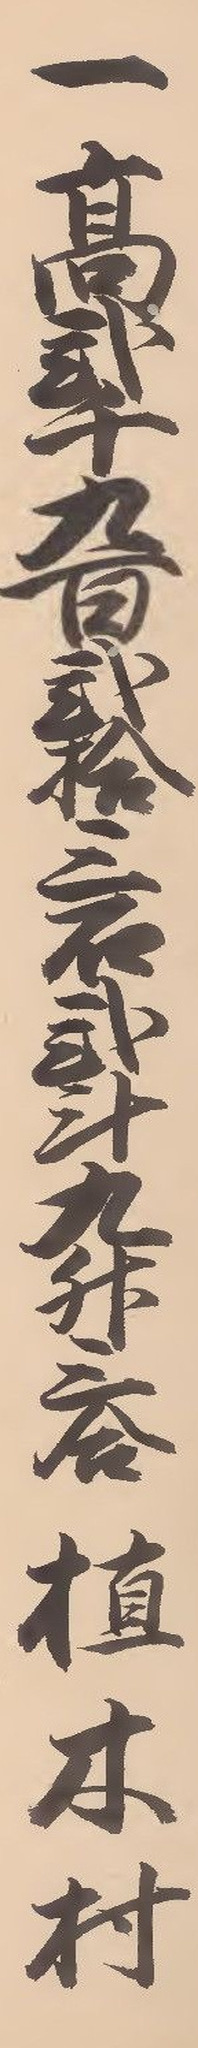一高弐千九百弐拾三石弐斗九升三合植木村
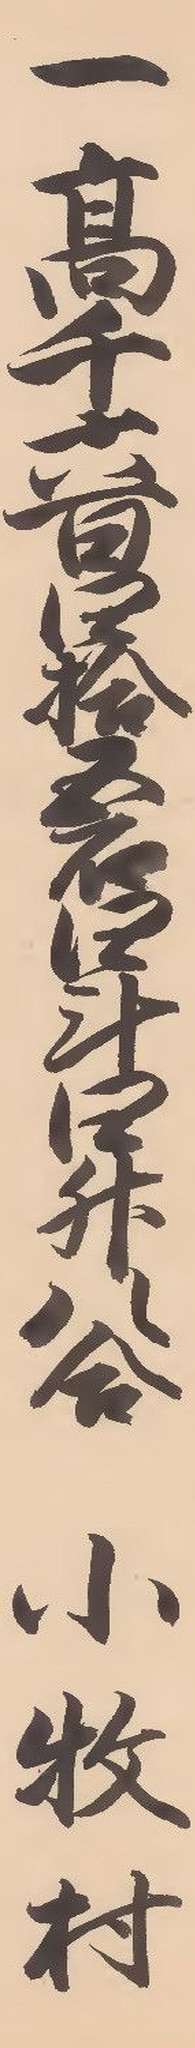一高千六百四拾五石四斗四升八合小牧村
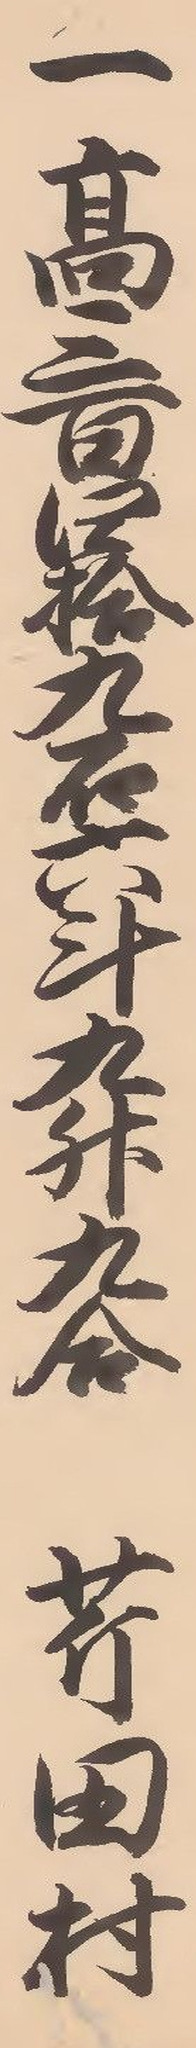一高三百四拾九石六斗九升九合芹田村
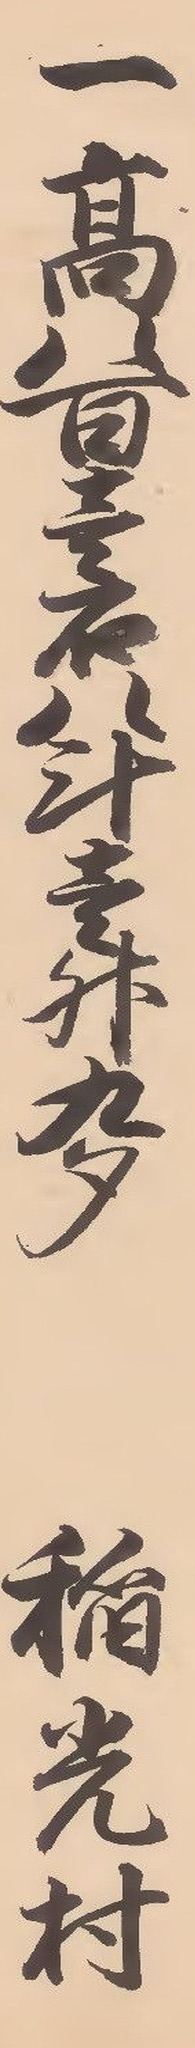一高八百壱石八斗壱升九勺稲光村

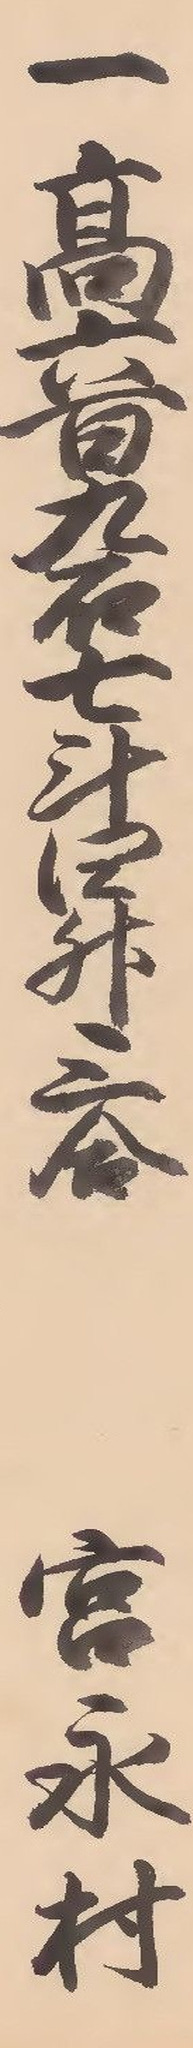一高六百九石七斗四升三合宮永村
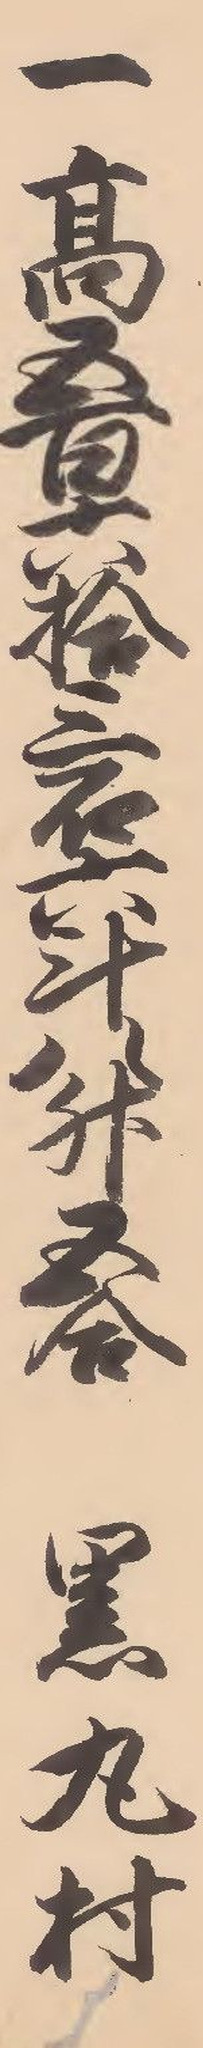一高五百六拾三石六斗八升五合黒丸村
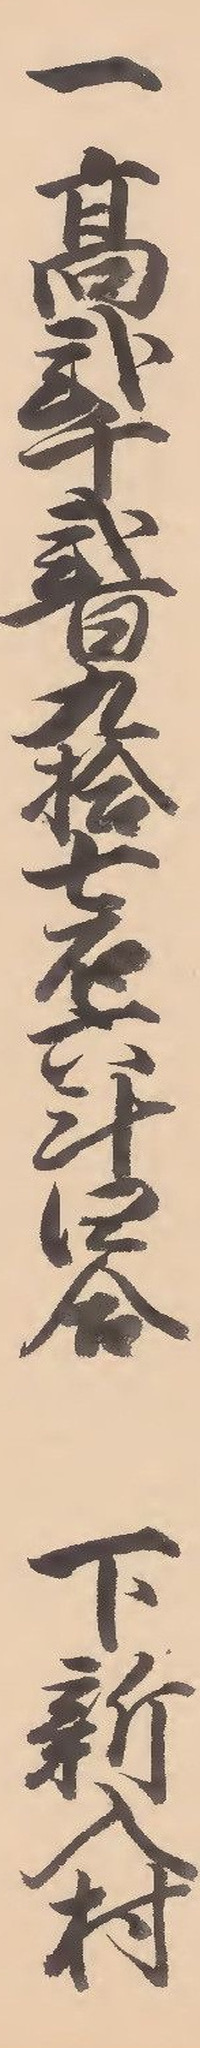一高弐千弐百九拾七石六斗四合下新入村
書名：筑前国郷帳
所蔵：国立公文書館 National Archives of Japan
